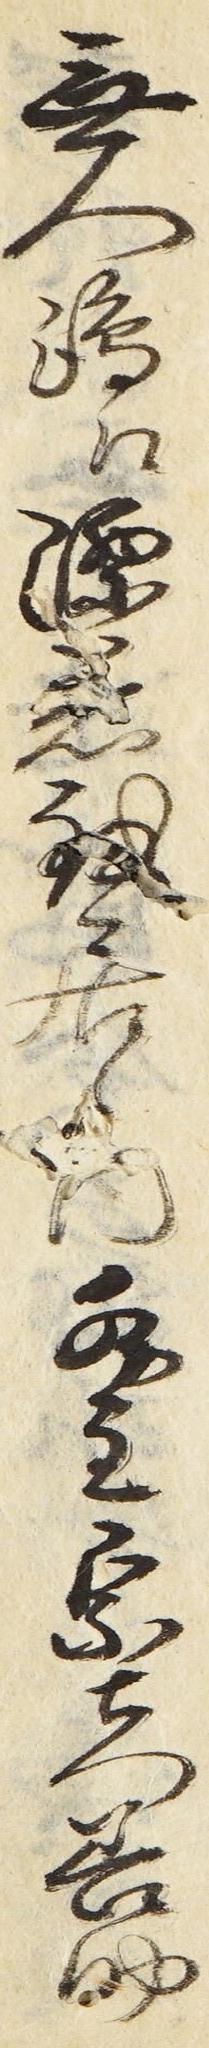無人嶋江漂着致居候内水主宗右衛門善助
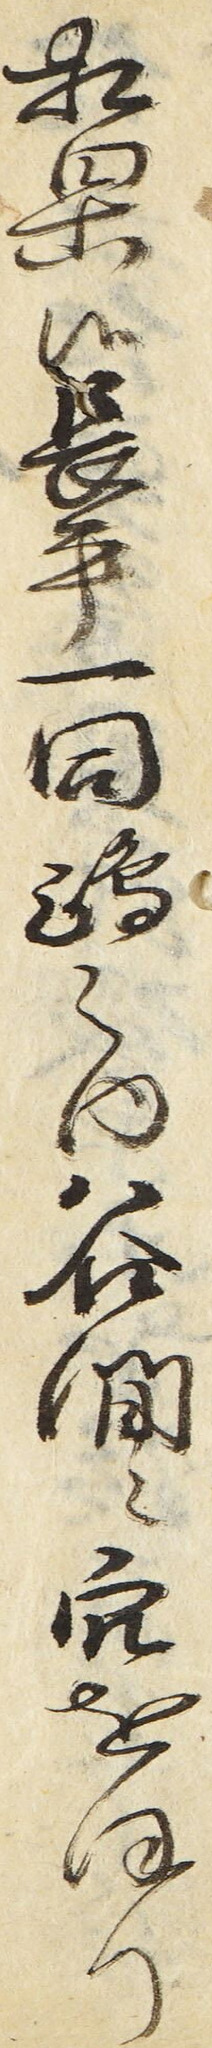相果候長平一同嶋之内谷澗ニ穴をほり

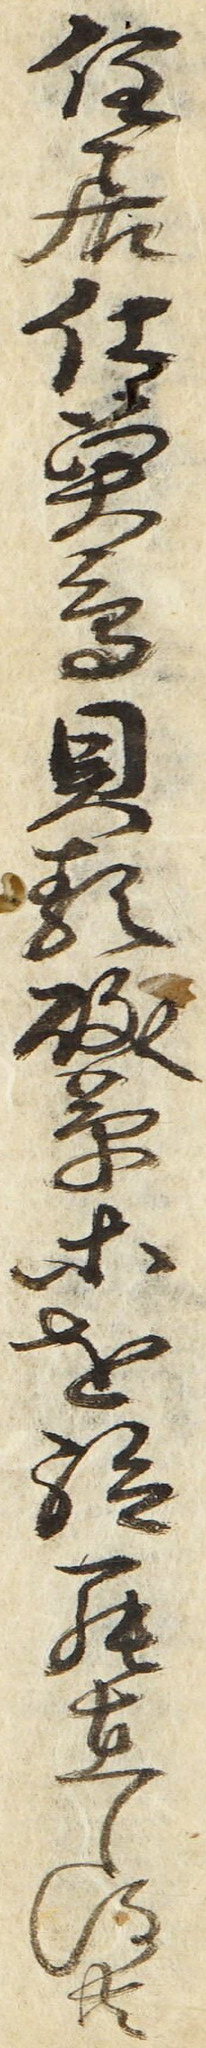住居仕魚鳥貝類磯草等を給罷在候得共
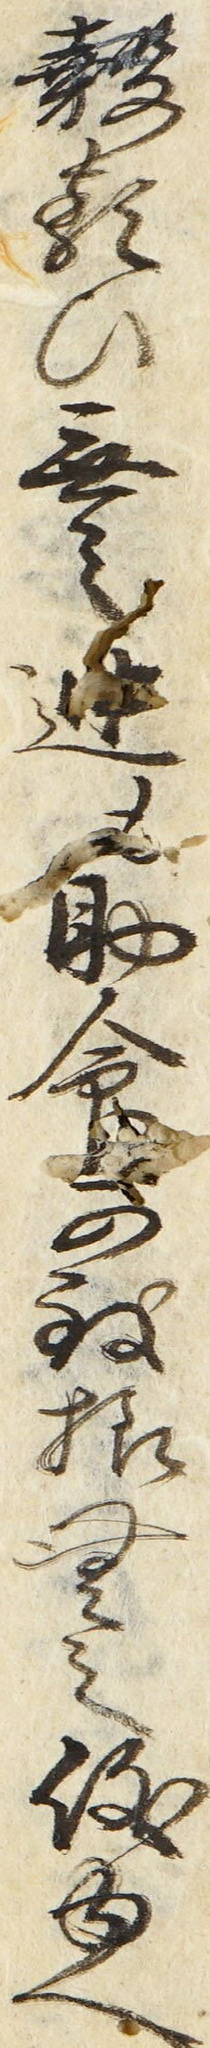穀類ひ無之迚も助命可致様無之儀ゆへ
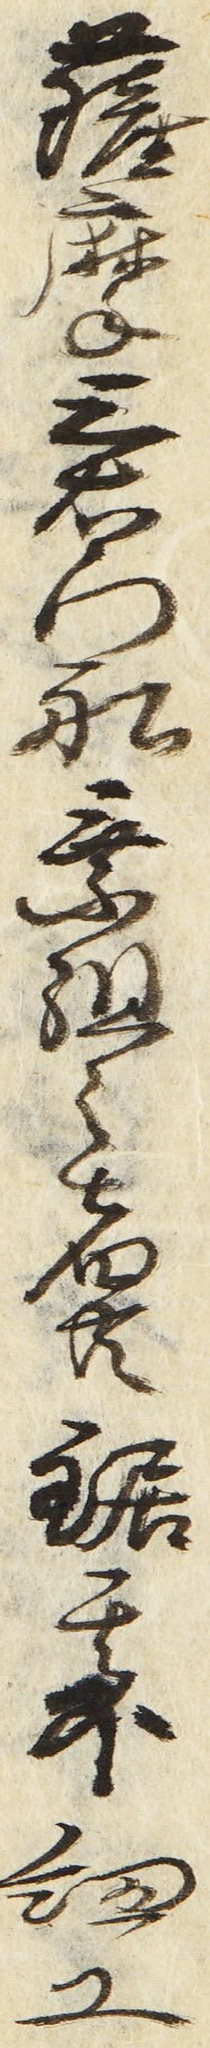薩摩三右衛門船乗組之者共鋸其外細工
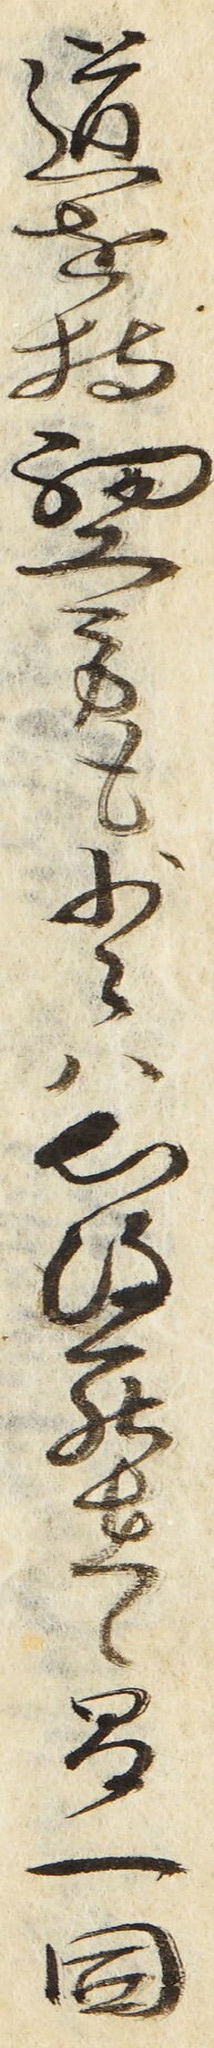道を持細工方も少々ハ心得罷在候間一同
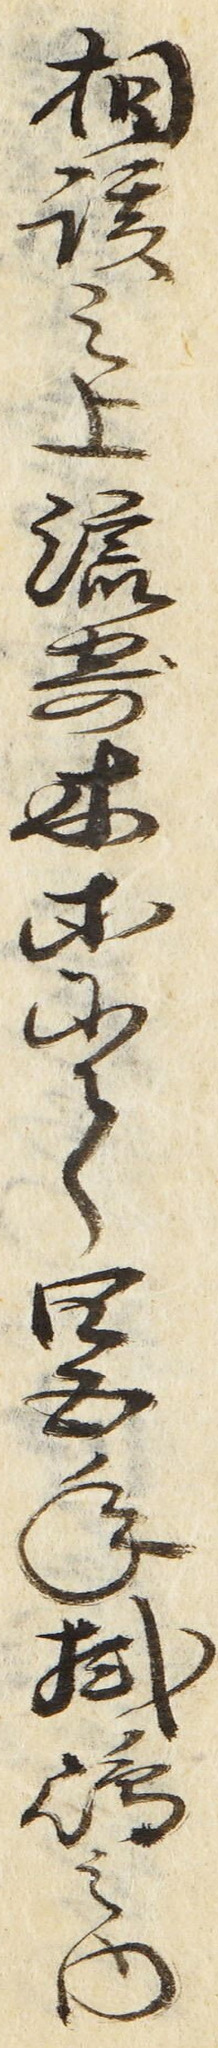相談之上流寄木等にて四五年掛嶋之内
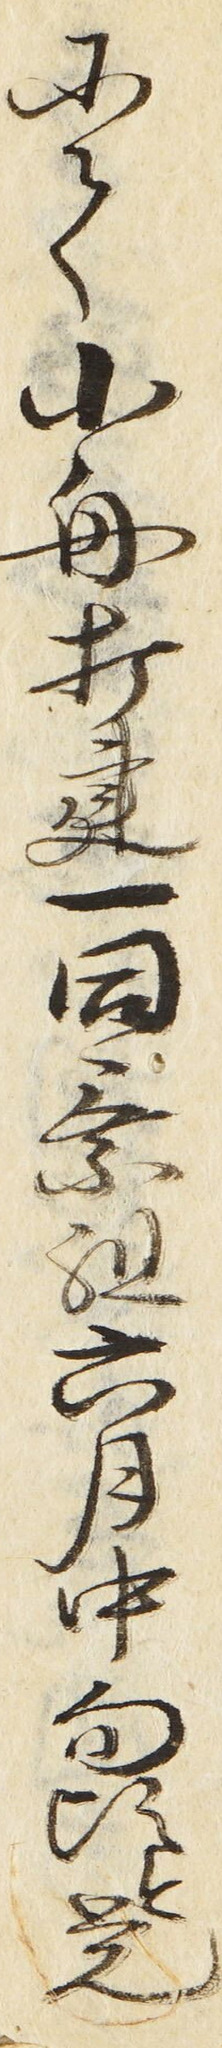にて小舟打建一同乗組六月中旬頃と覚
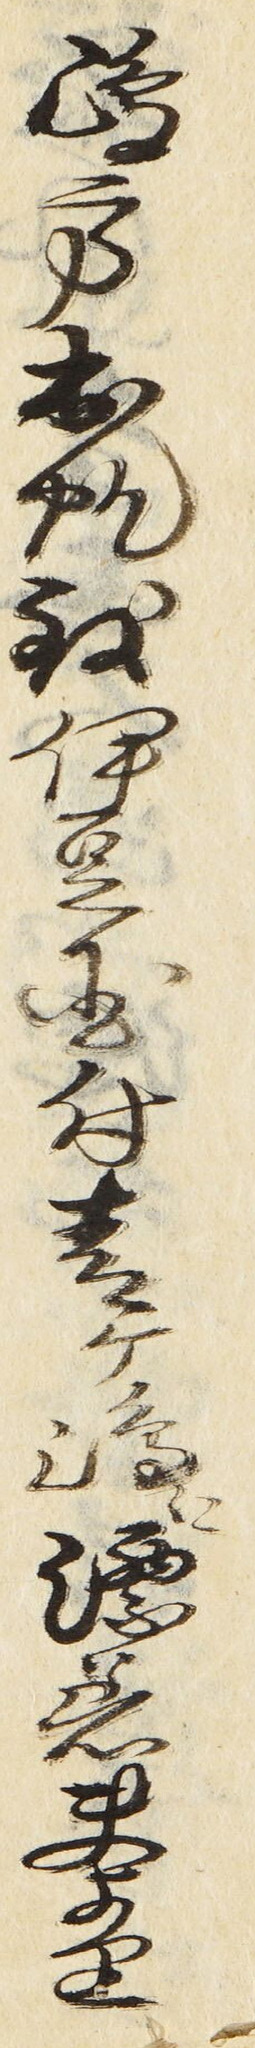嶋方出帆致伊豆国付青ケ嶋漂着夫より
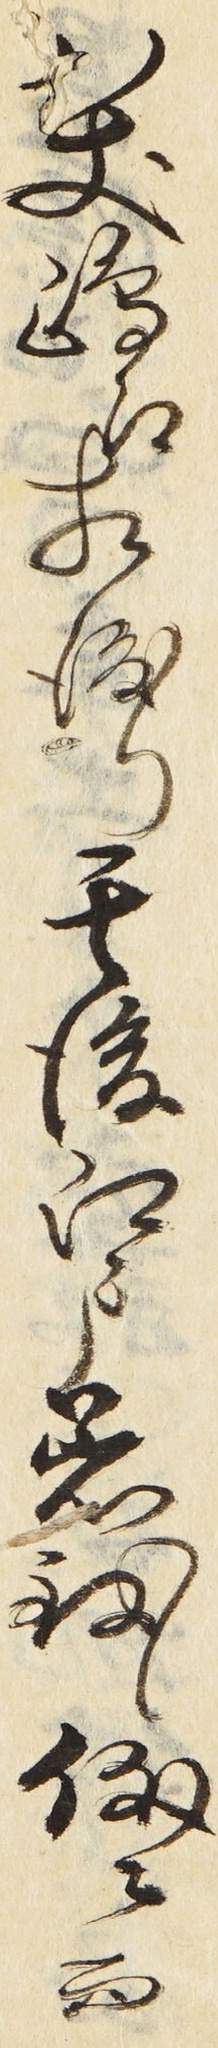八丈嶋江相渡り其後江戸着致候儀ニ而
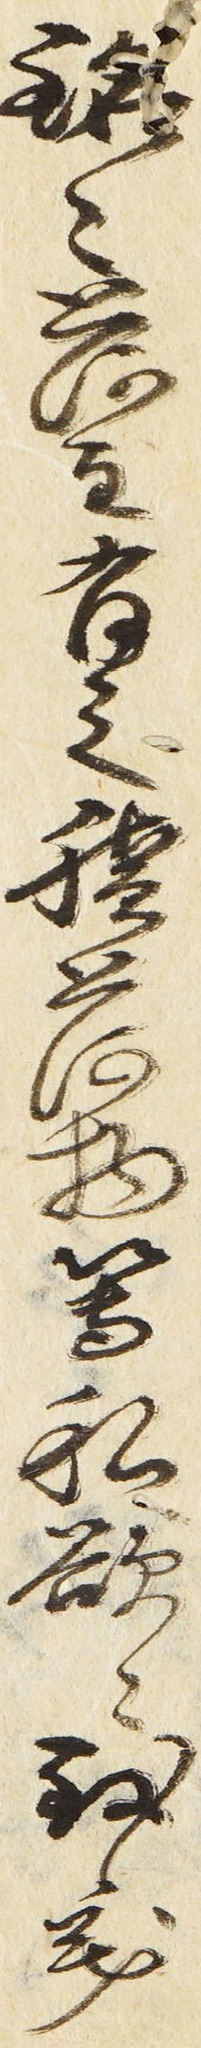銘々荷主有之積荷物等私欲ニ致候義
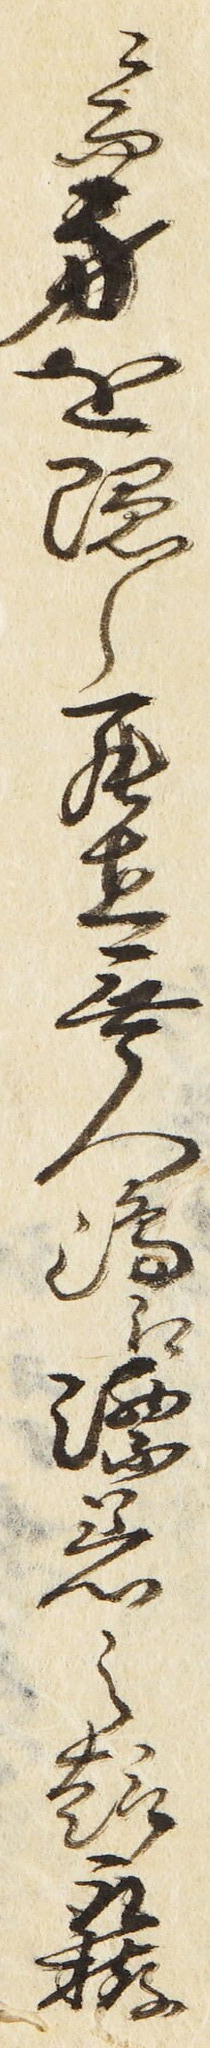ニ而身を隠し罷在無人嶋江漂着之趣取拵
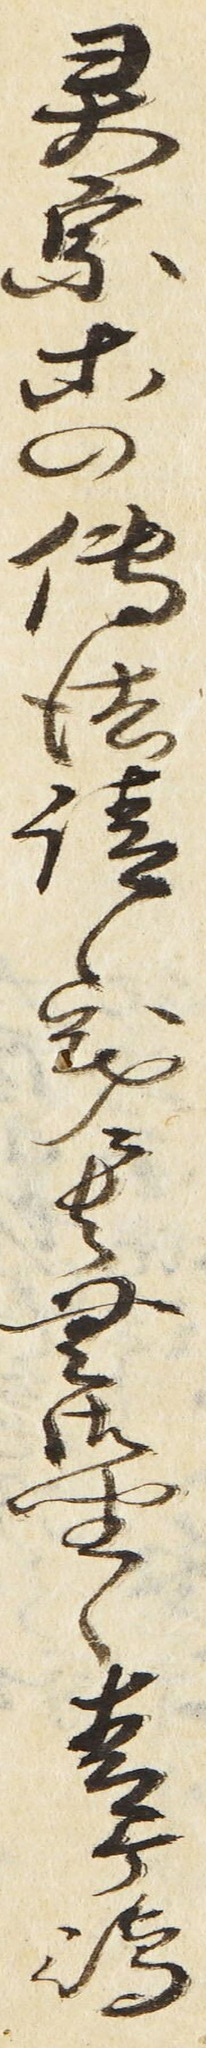異宗等の伝法請候義ニ者無御座候青ケ嶋
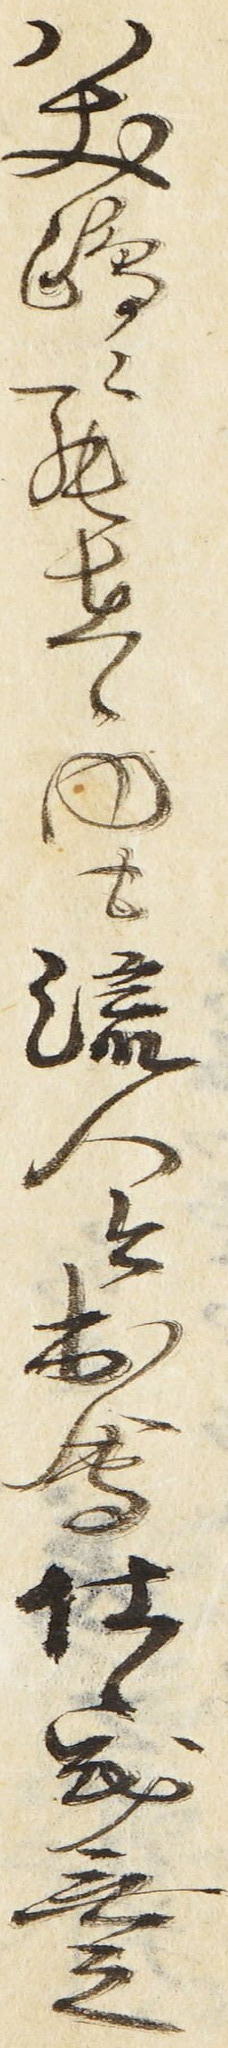八丈嶋ニ罷在候内も流人と出会仕候義無之
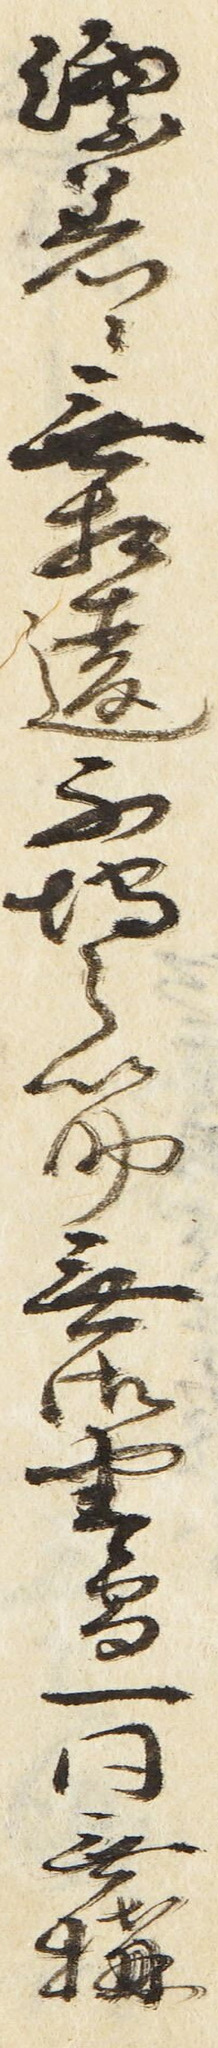漂着ニ無相違不埒之筋無御座候間一同無構
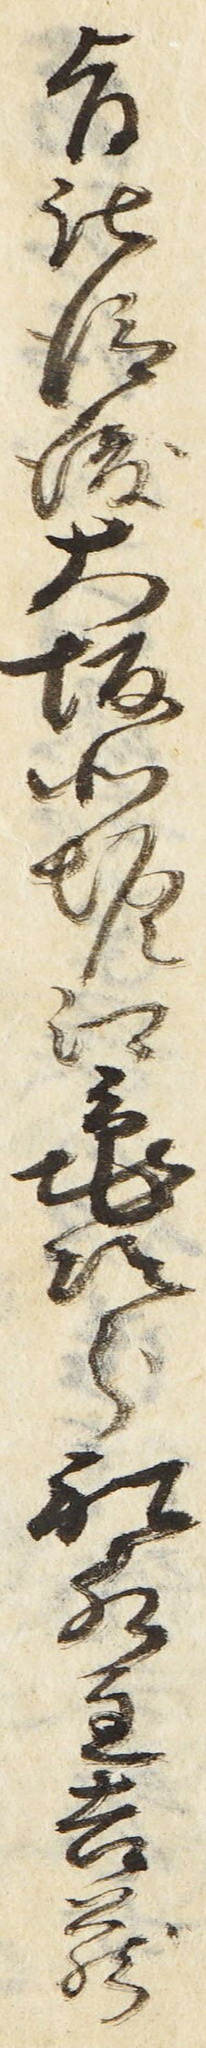旨被仰渡大坂北堀江亀次郎船水主吉蔵
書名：漂流一件上書
